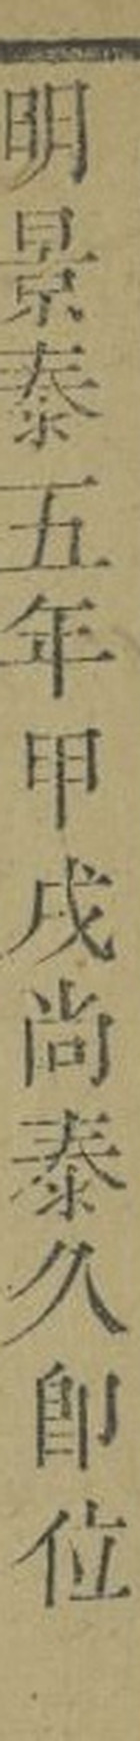明景泰五年甲戌尚泰久即位
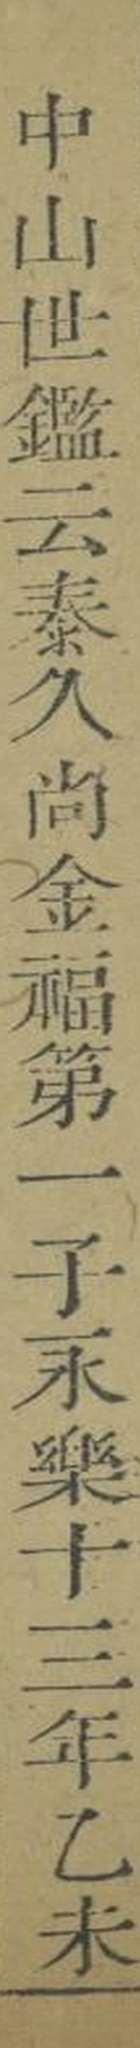中山世鑑云泰久尚金福第一子永楽十三年乙未
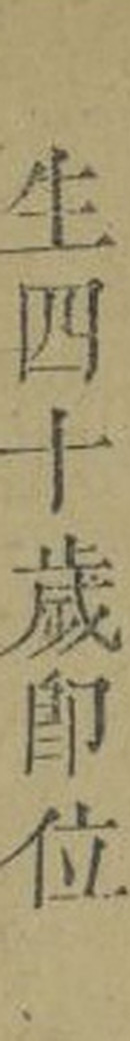生四十歳即位
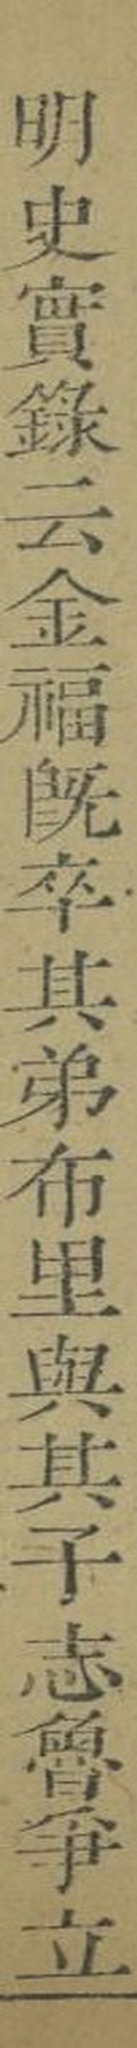明史実録云金福既卒其弟布里与其子志魯争立
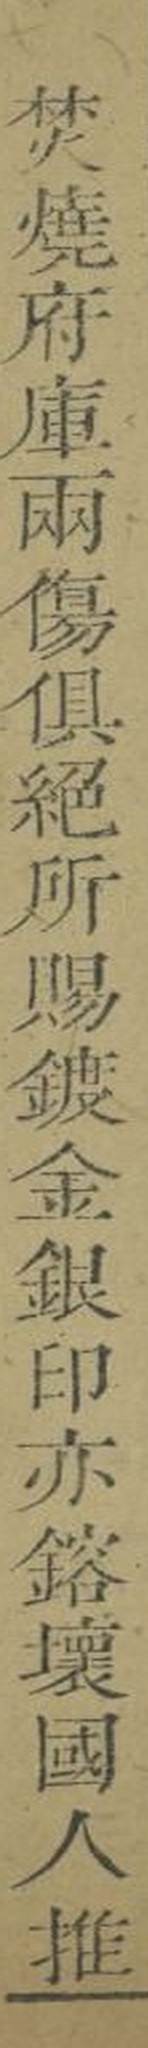焚焼府庫両傷俱絶所賜鍍金銀印亦鎔壊国人推
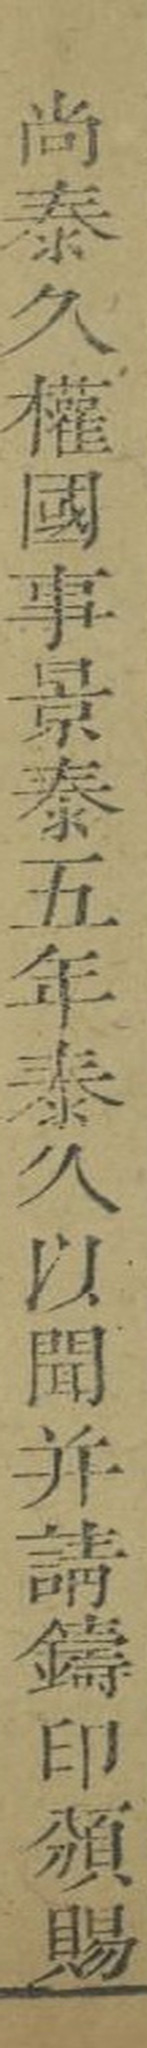尚泰久権国事景泰五年泰久以聞并請鋳印頒賜
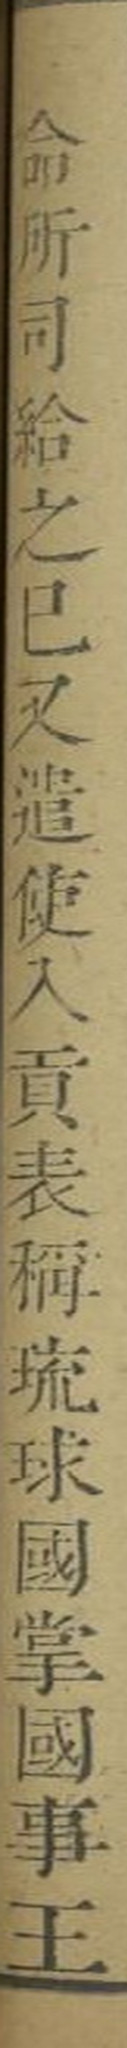命所司給之巳又遣使入貢表称琉球国掌国事王
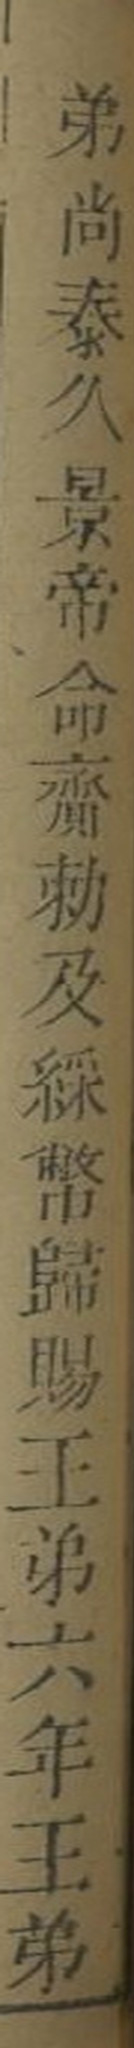弟尚泰久景帝命齎勅及綵幣帰賜王弟六年王弟
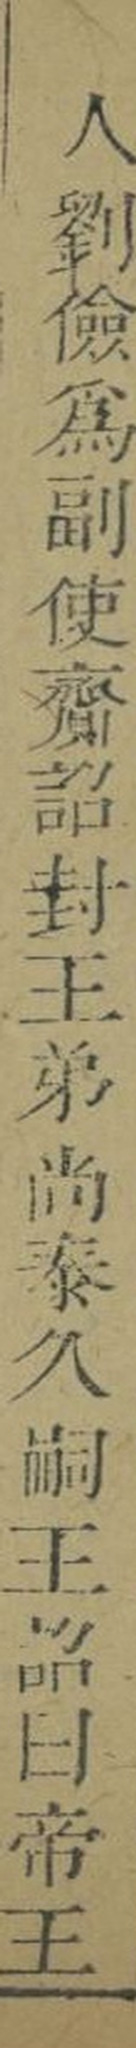人劉倹為副使齎詔封王弟尚泰久嗣王詔曰帝王
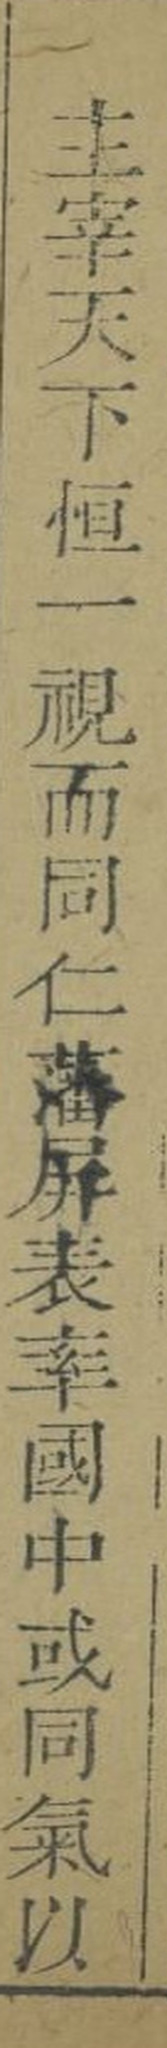主宰天下恒一視而同仁藩屏表率国中或同気以
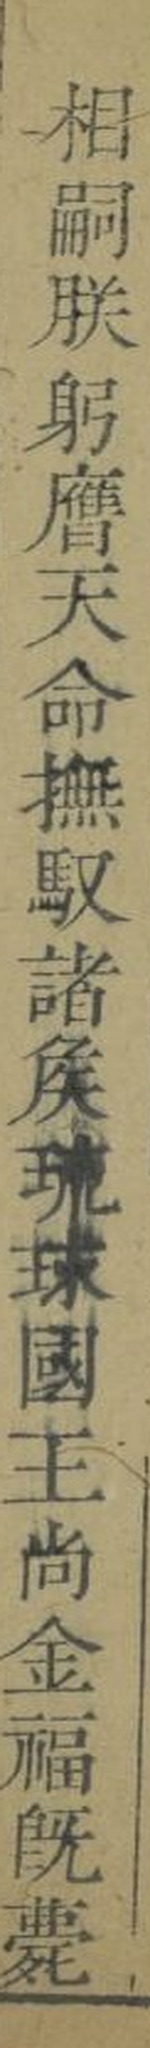相嗣朕躬膺天命撫馭諸侯琉球国王尚金福既薨
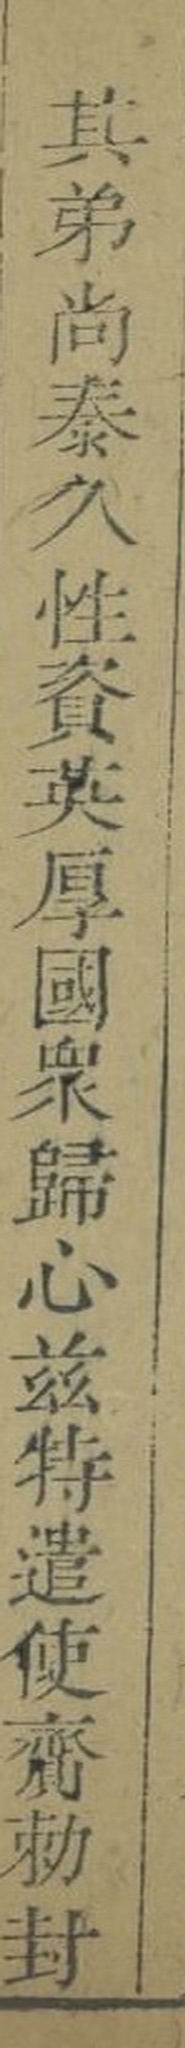其弟尚泰久性資英厚国衆帰心茲特遣使齎勅封
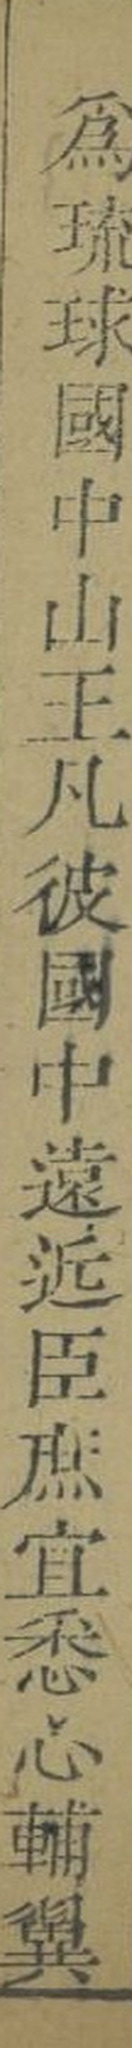為琉球国中山王凡彼国中遠近臣庶宜悉心輔翼
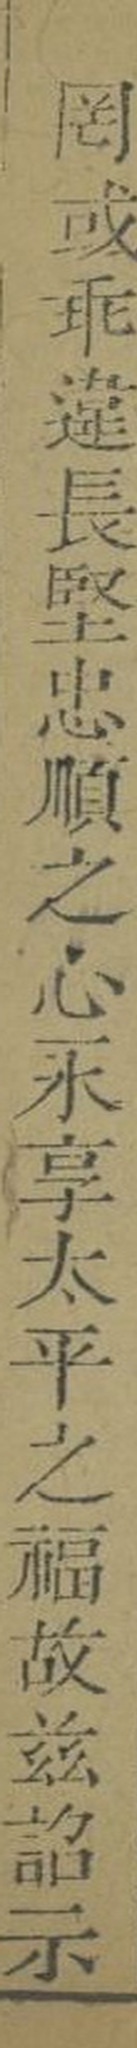罔或乖違長堅忠順之心永享太平之福故茲詔示
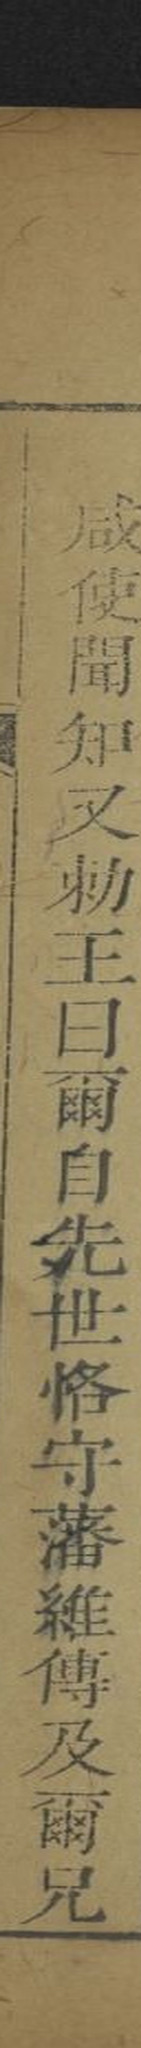咸使聞知又勅王曰爾自先世恪守藩維伝及爾兄
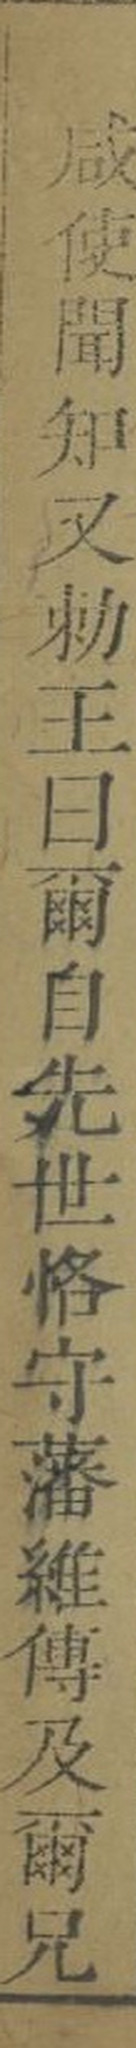咸使聞知又勅王曰爾自先世恪守藩維伝及爾兄
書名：中山伝信録 巻三
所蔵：University of the Ryukyus Library
